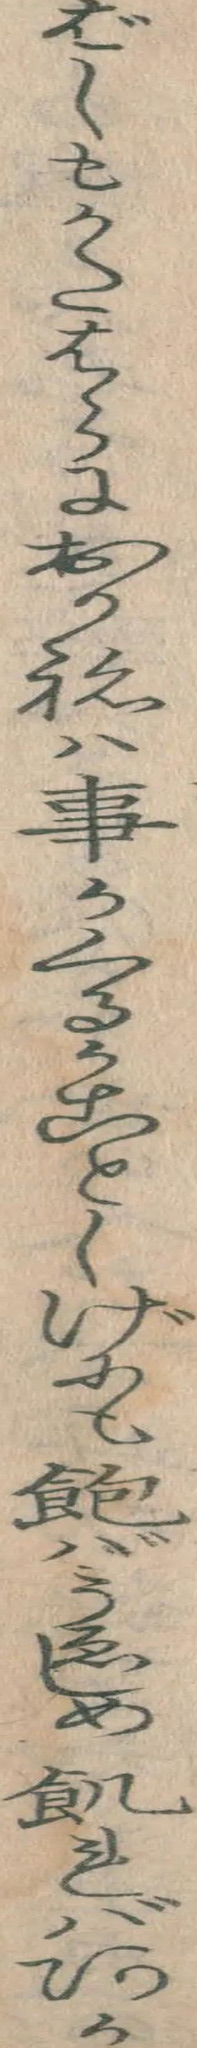ばしもかたはらにおかねは事かくるかことしげにも飽ばうゑしめ飢ればあか

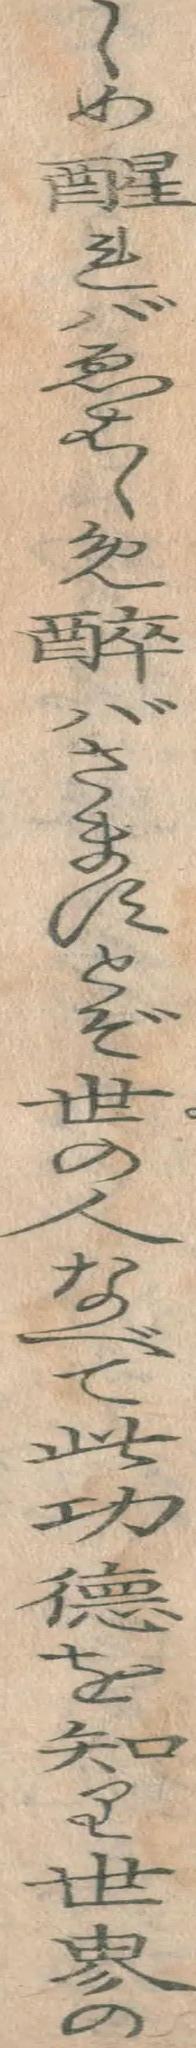しめ醒ればゑはしめ酔ばさますとぞ世の人なべて此功徳を知り世界の
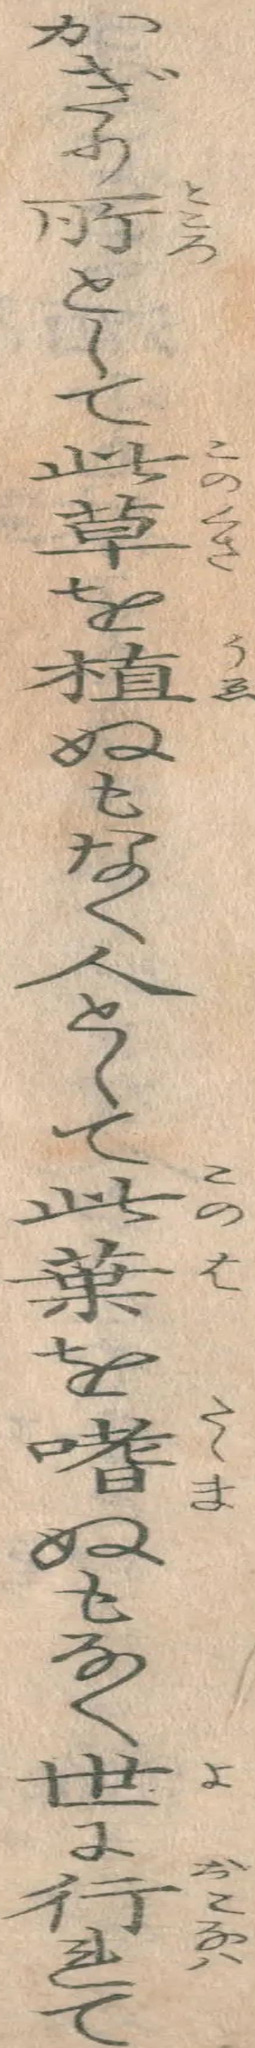かぎり所として此草を植ぬもなく人として此葉を嗜ぬもなく世に行れて
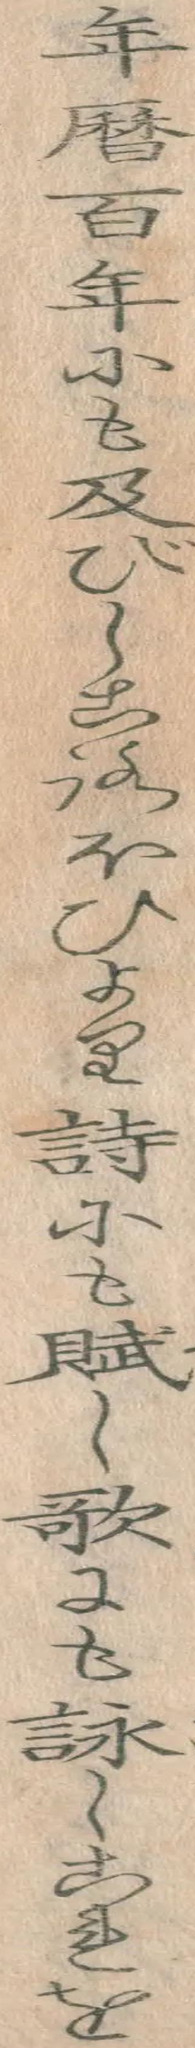年暦百年にも及びしころほひより詩にも賦し歌にも詠しこれを
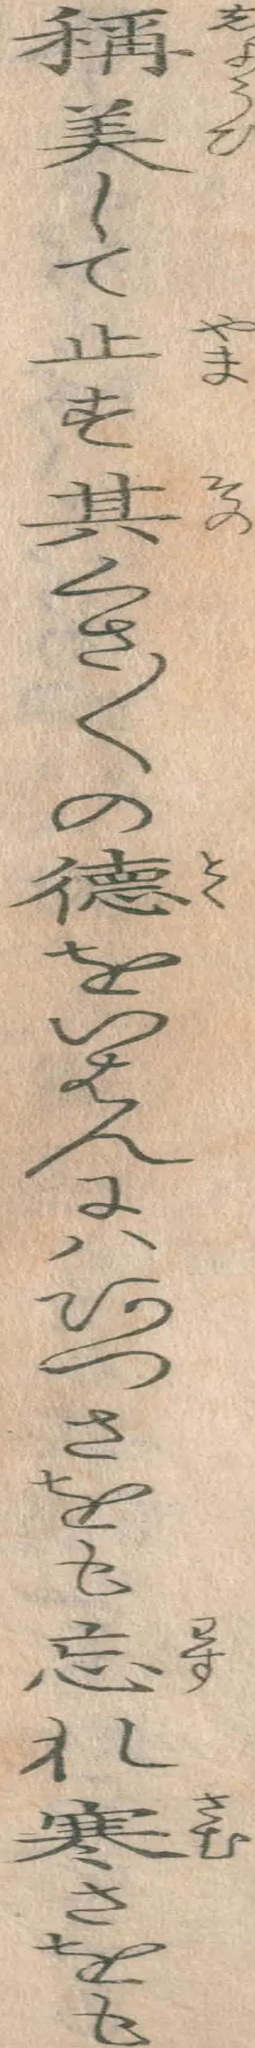称美して止す其くさ〳〵の徳をいはんにはあつさをも忘れ寒さをも
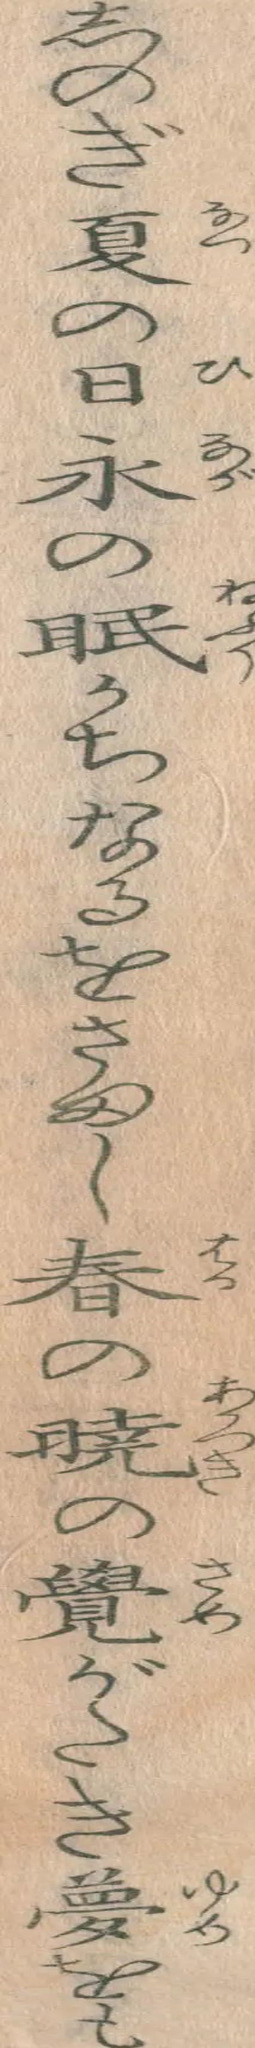しのぎ夏の日永の眠かちなるをさまし春の曉の覚がたき夢をも
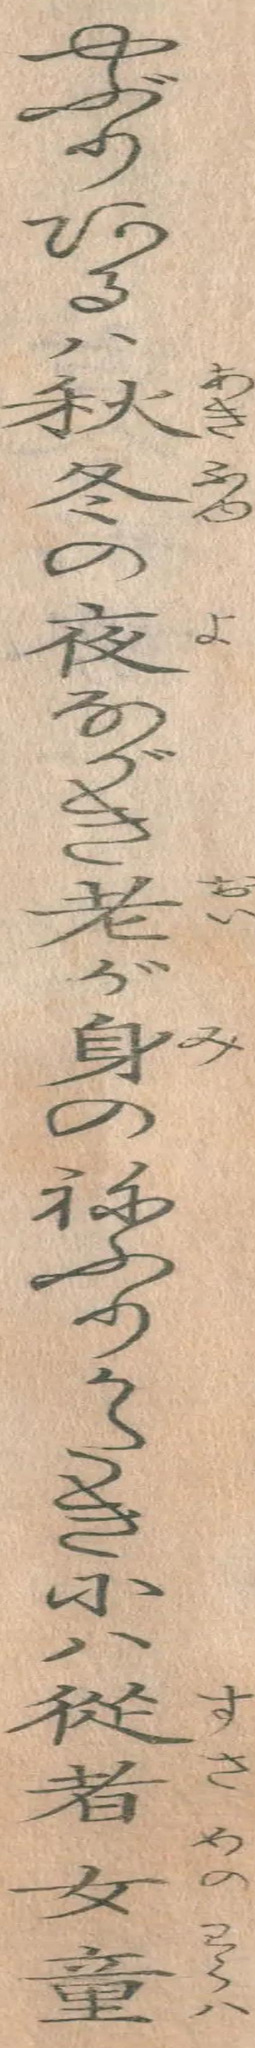やぶりあるは秋冬の夜ながき老が身のねふりかたきには従者女童
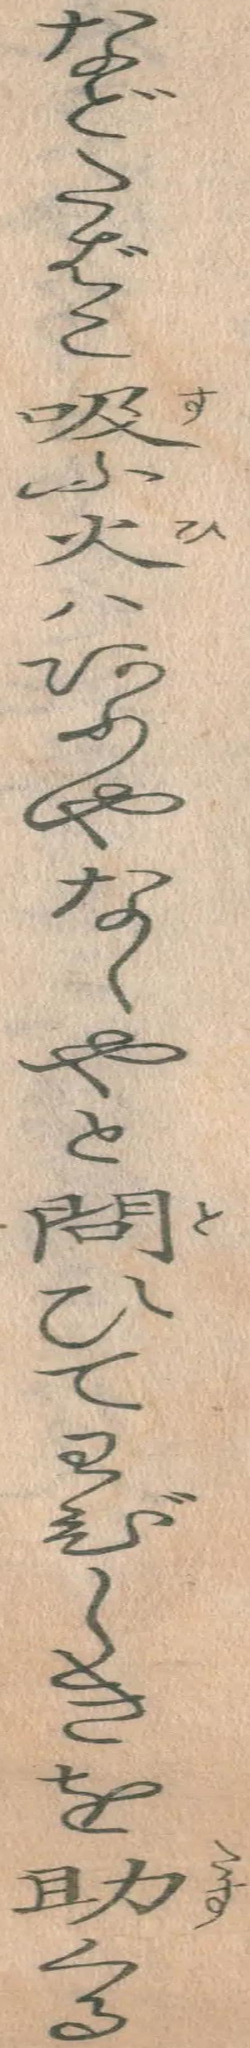などたばこ吸ふ火はありやなしやと問ひてわびしきを助くる
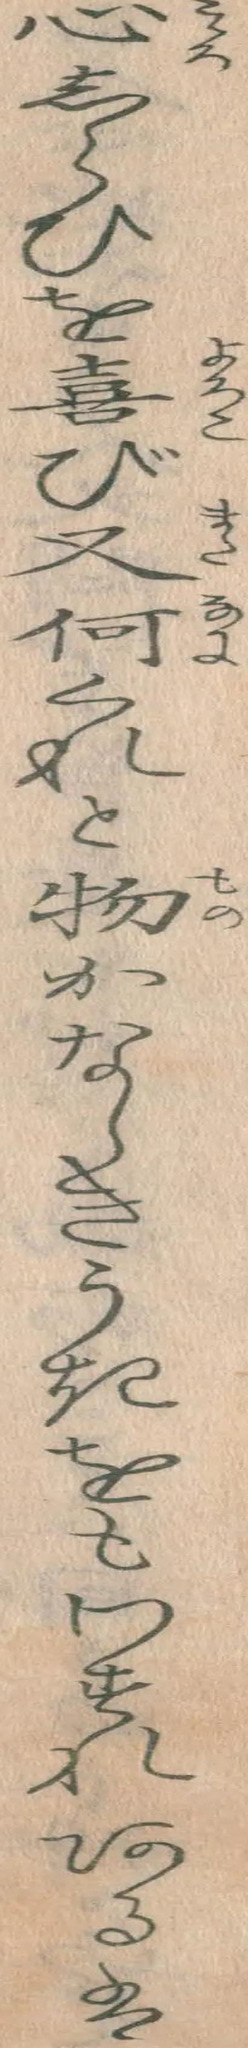心しらひを喜び又何くれと物かなしきうきをもわすれあるは
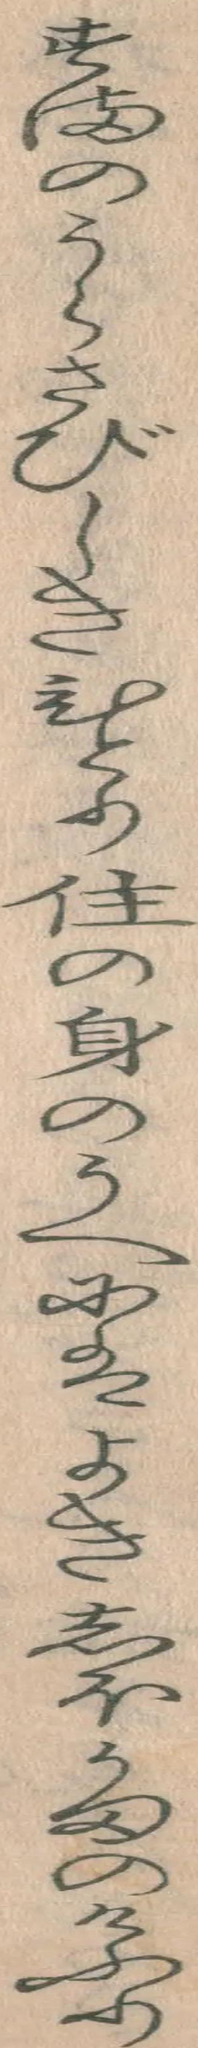すまのうらさびしきひとり住の身のうへにはよきしほかまのけふり
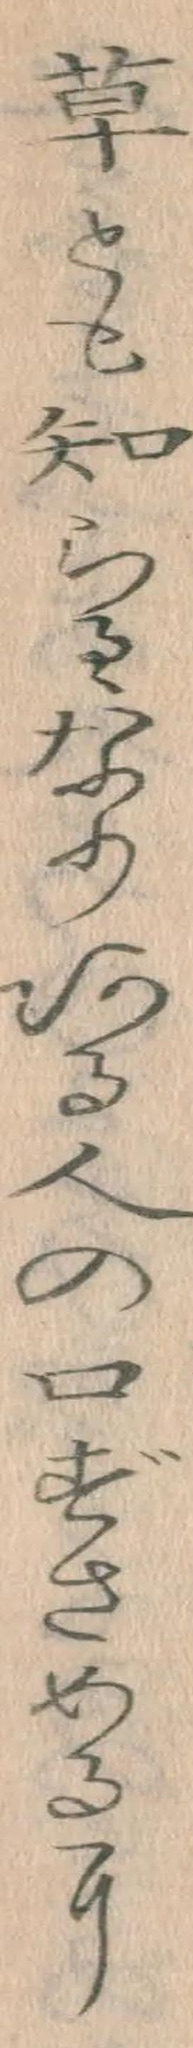草とも知らるゝなりある人の口ずさめるに
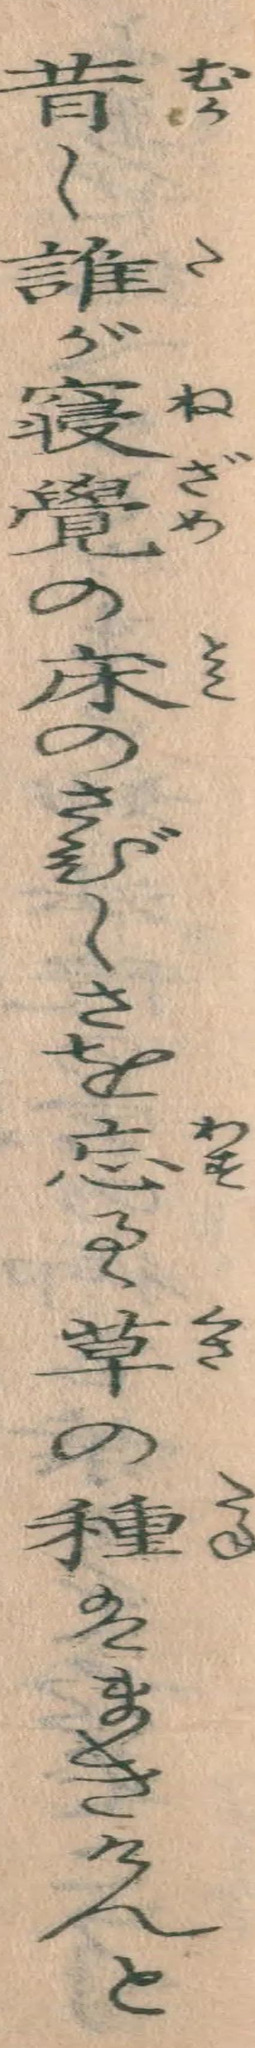昔し誰が寝覚の床のさびしさを忘るゝ草の種はまきけんと
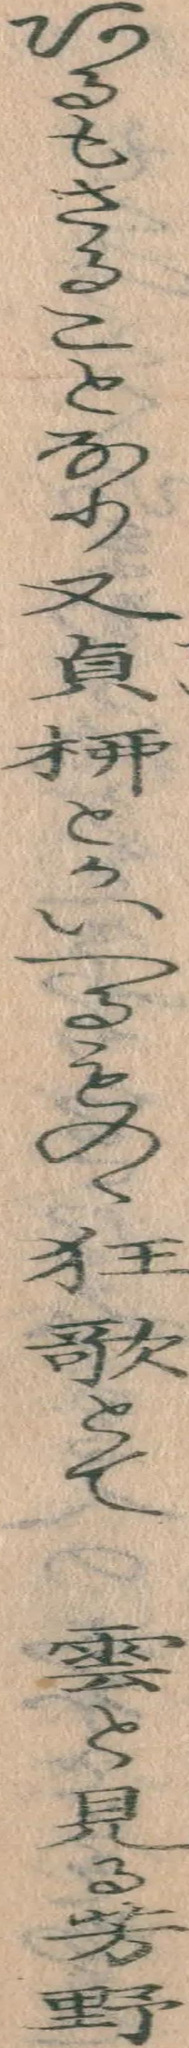あるもさることなり又貞柳とかいへるものゝ狂歌とて雲と見る芳野
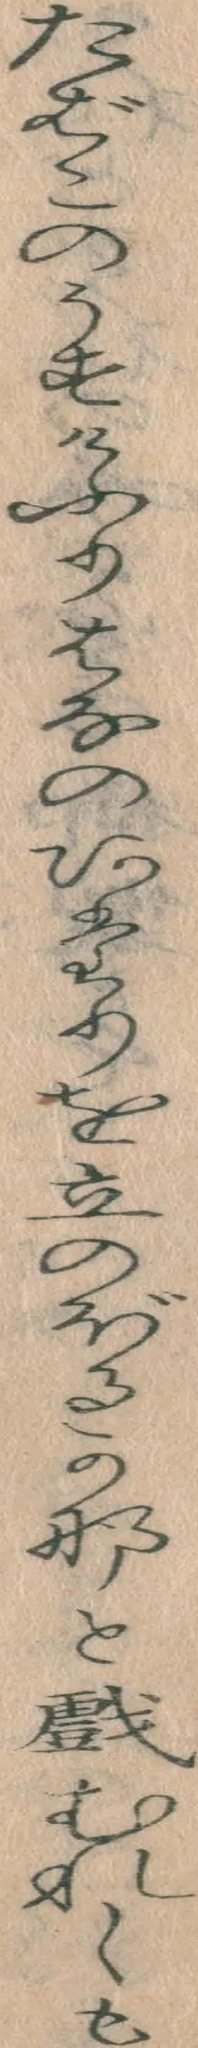たばこのうすけふりはなのあたりを立のぼるかなと戯むれしも
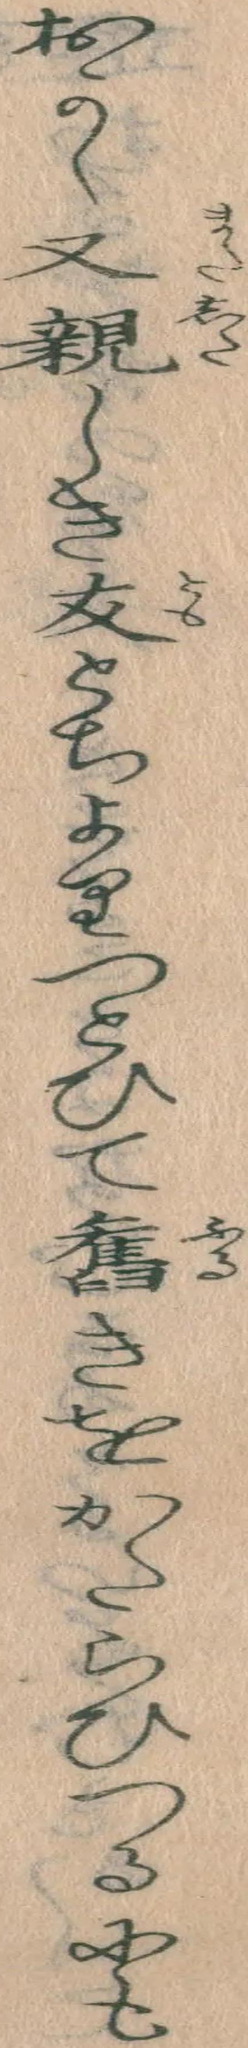おかし又親しき友とちよりつとひて旧きをかたらひつるにも
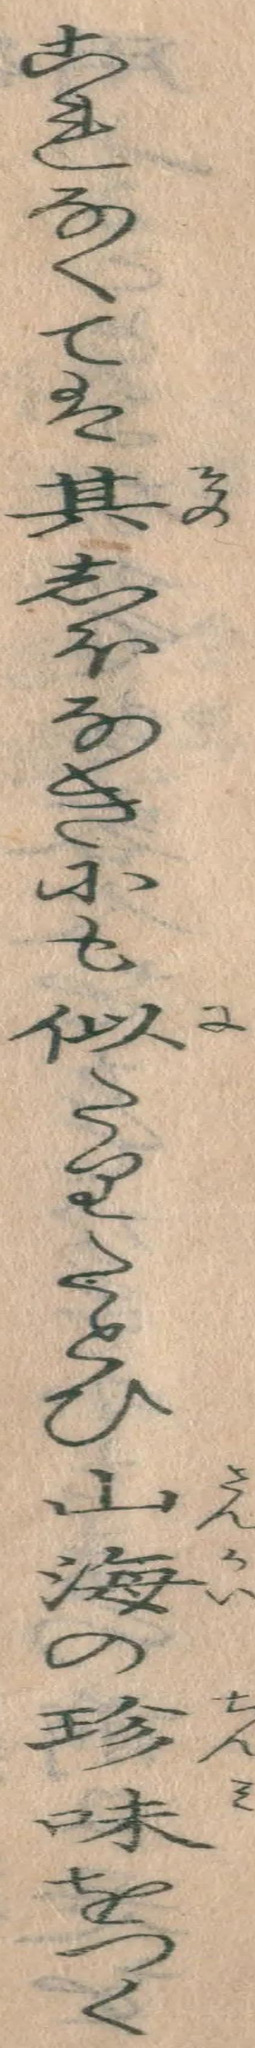これなくては其しほなきにも似たりたとひ山海の珍味をつく
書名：目さまし草
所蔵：国立国会図書館 National Diet Library, JAPAN
